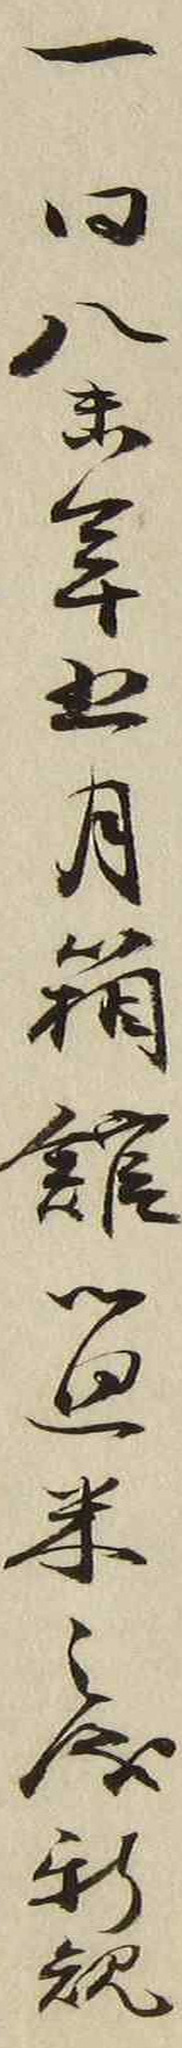一同八未年五月箱館御廻米之儀新規
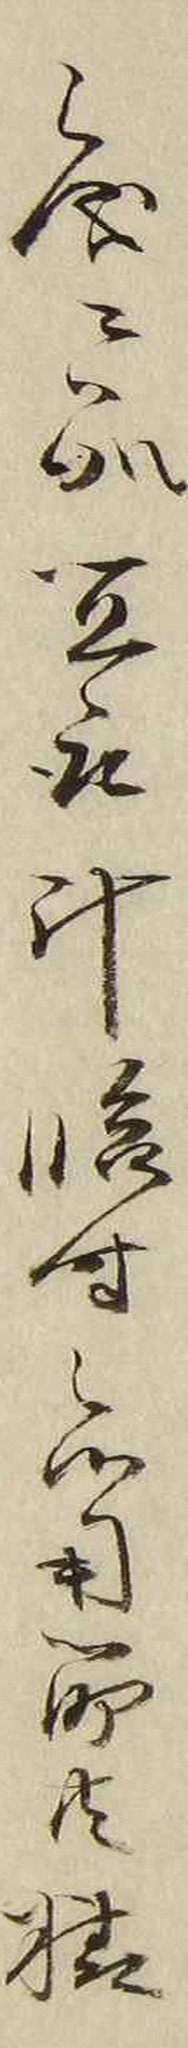之儀ニ候処宜取計臨時之御用節共精

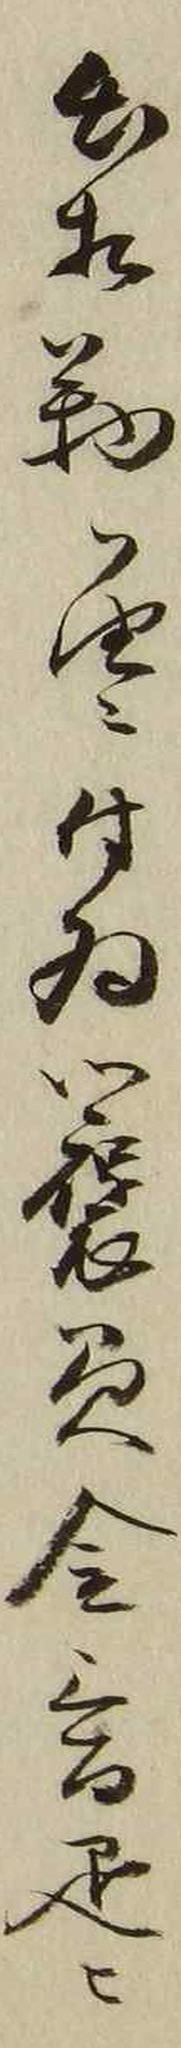出相勤候由ニ付為御褒美金三百疋被
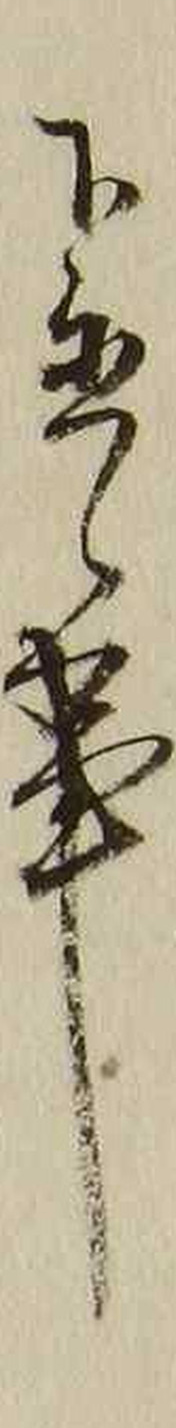下置候事
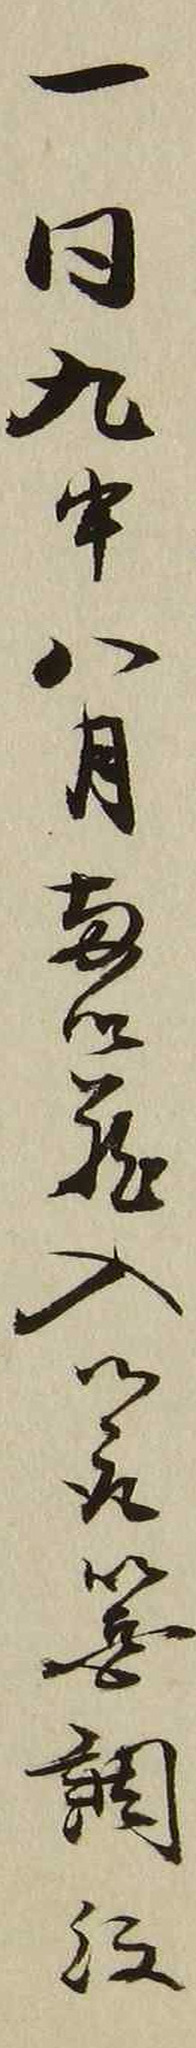一同九申八月南御蔵入御取箇調役
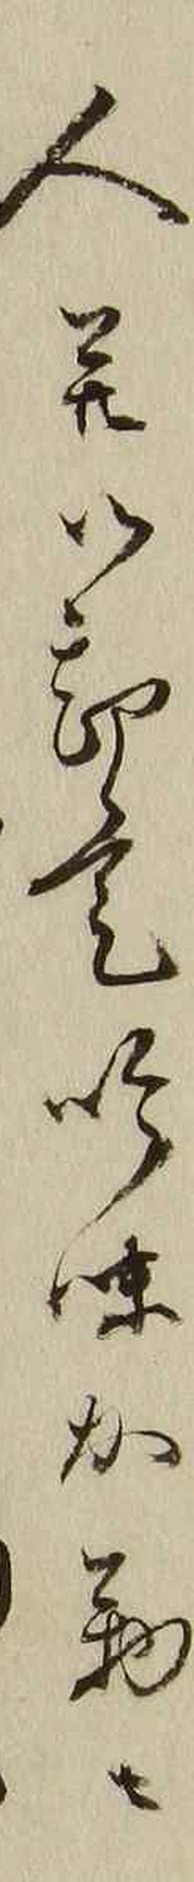人并御勘定吟味加勤被
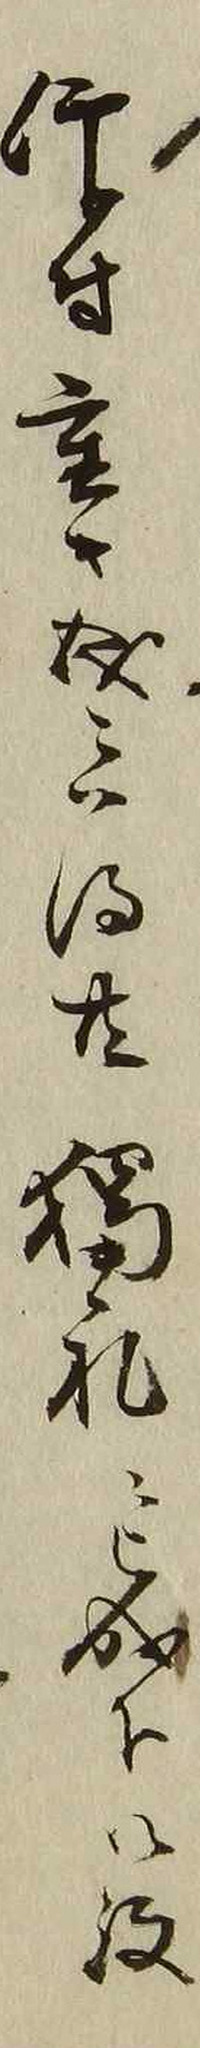仰付重キ儀ニ候得共独礼ニ被成下御役
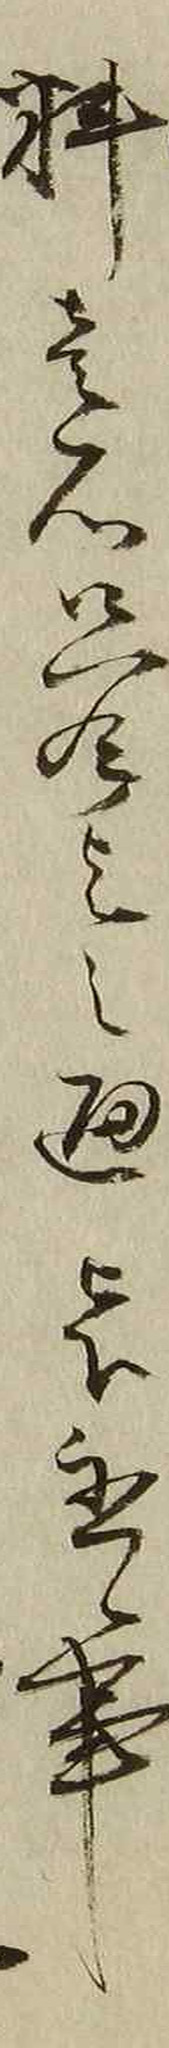料壱石只今迄之通被下置候事
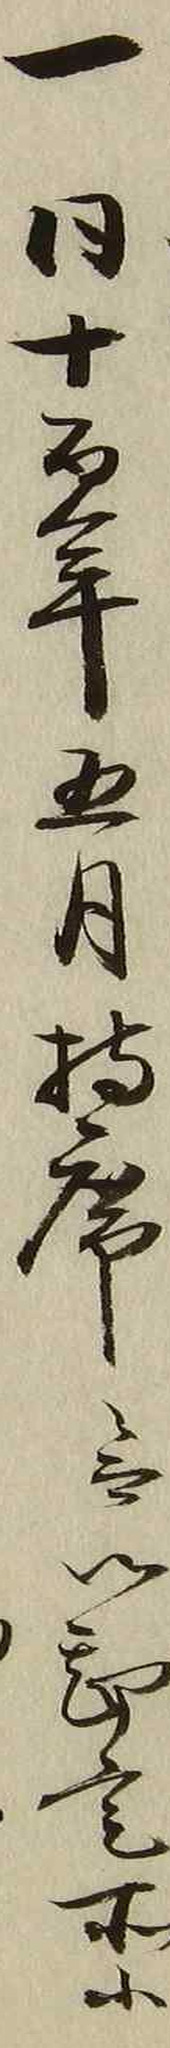一同十酉年五月持席ニ而御勘定所小
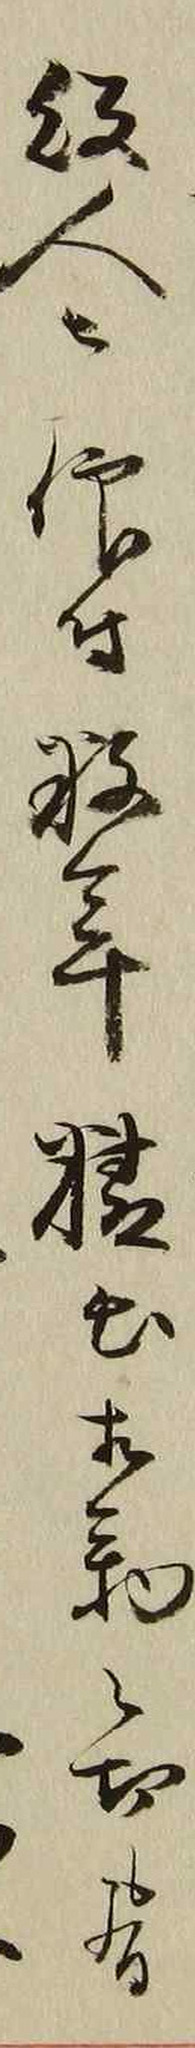役人被仰付数年精出相勤候功も有
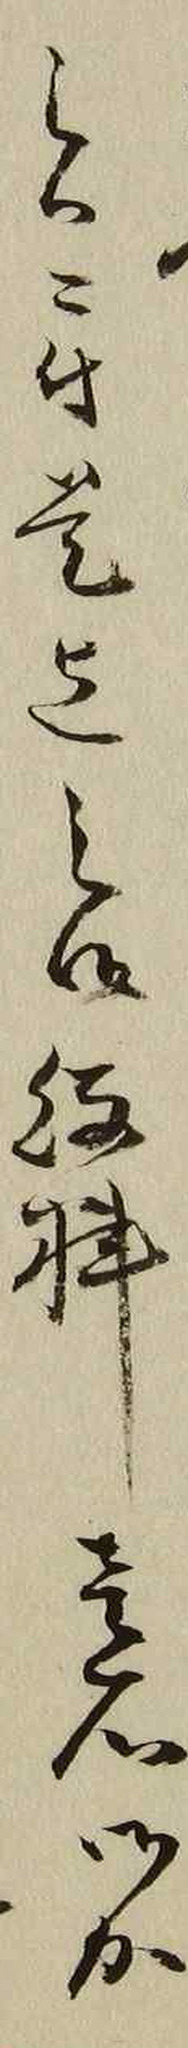之候ニ付是迄之御役料壱石御加
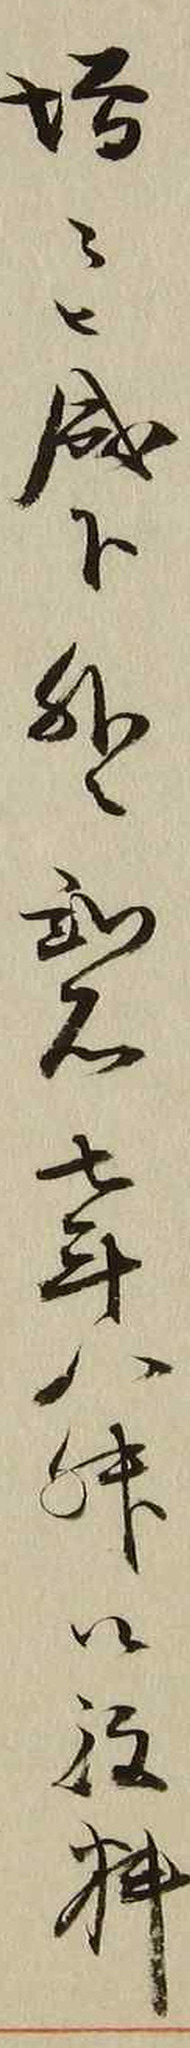増ニ被成下外へ弐石七斗八升御役料
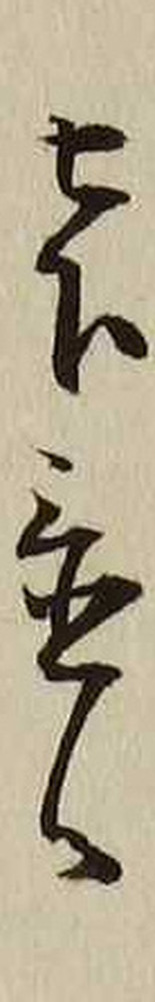被下置候
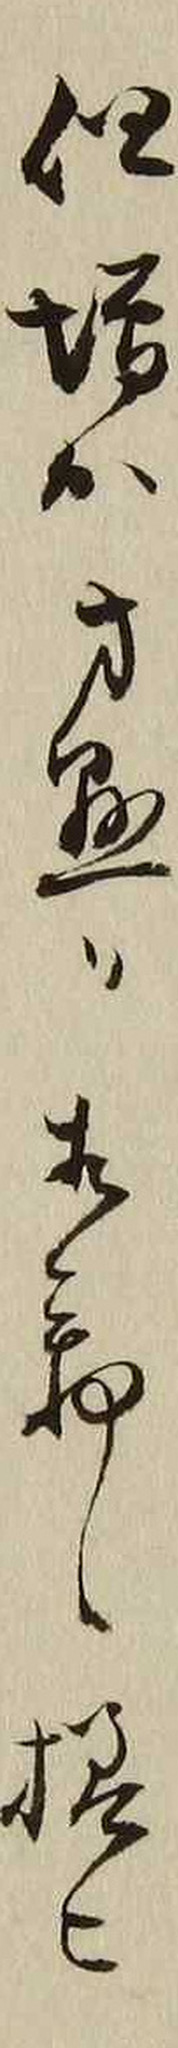但増加方懸り相勤候様被
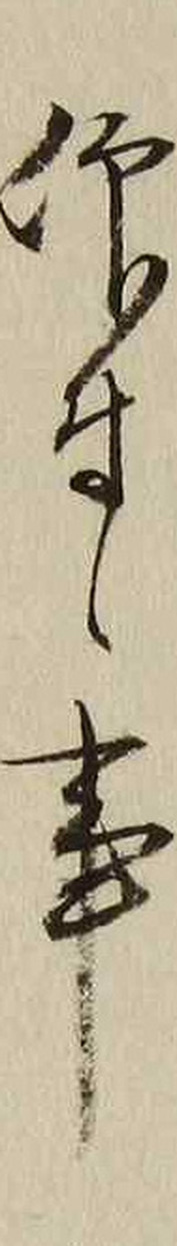仰付候事
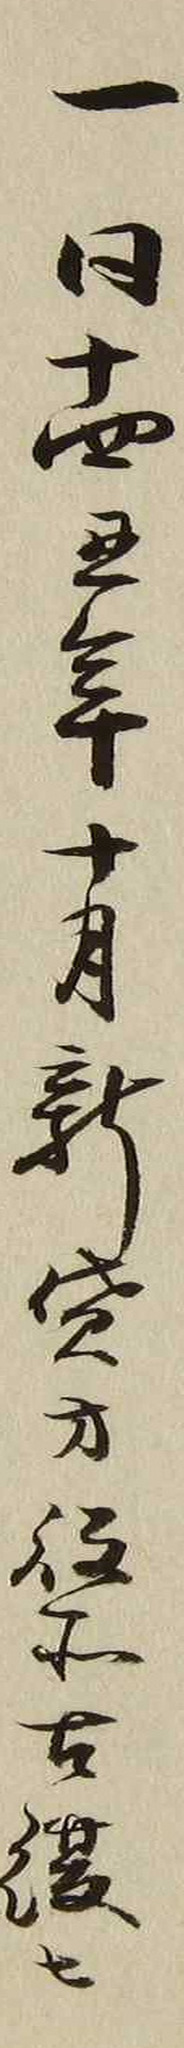一同十四丑年十月新貸方役所古復被
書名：諸士系譜　巻之291　さ之部23
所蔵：会津若松市立会津図書館
